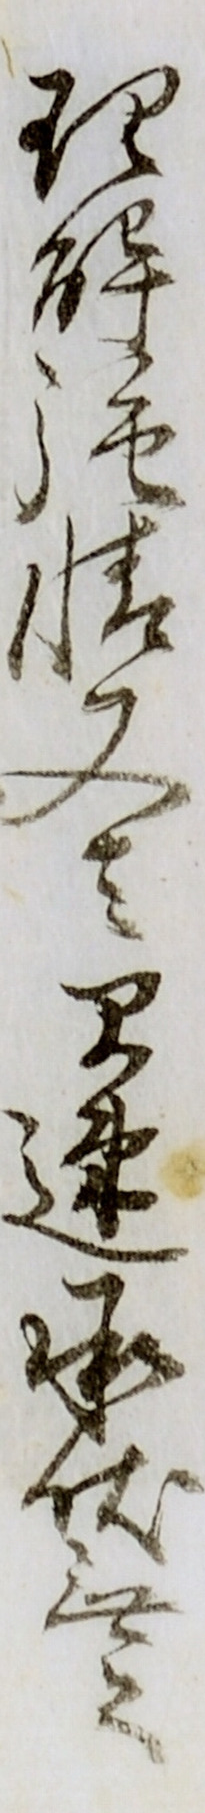理解強情又は早速承伏無之
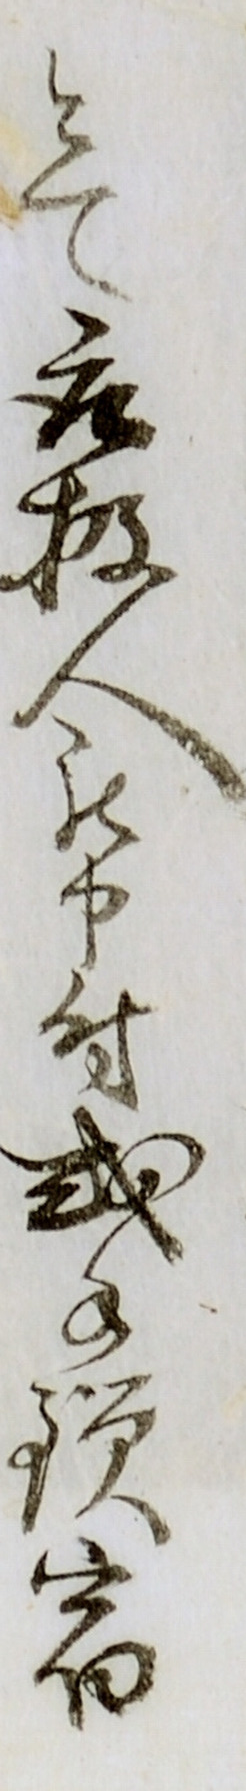とて取扱人被申付或手鎖宿
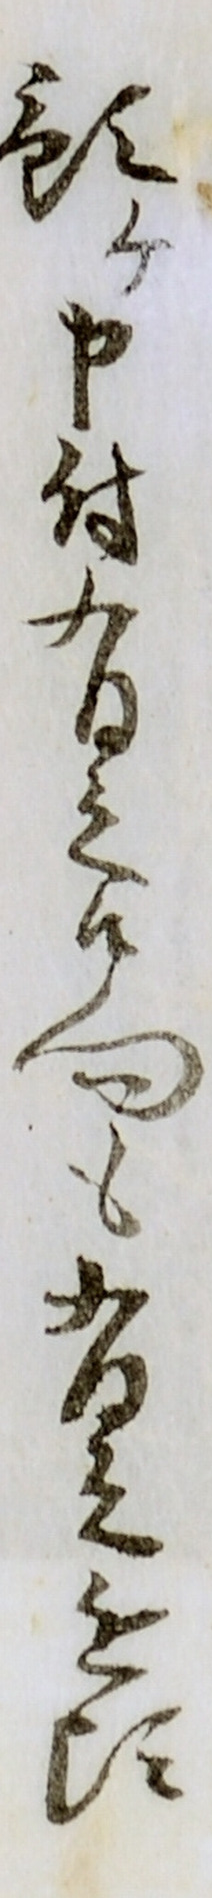預ケ申付有之候向も有之近頃
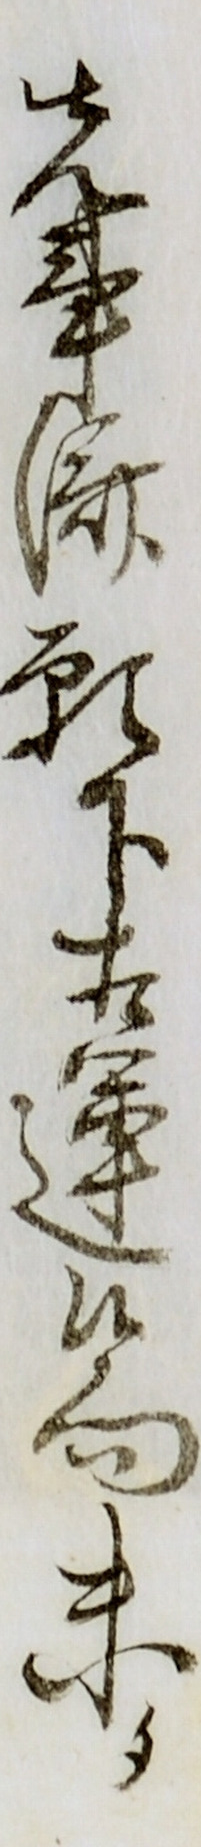先事済願下相運候向未タ
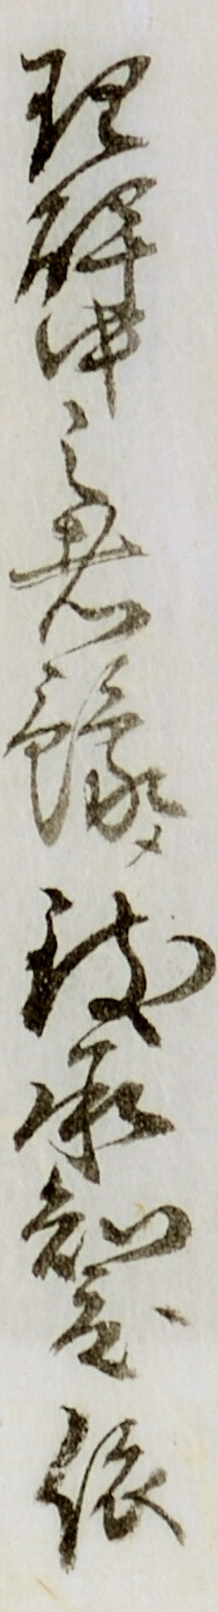理解中之者予メ致承知度依
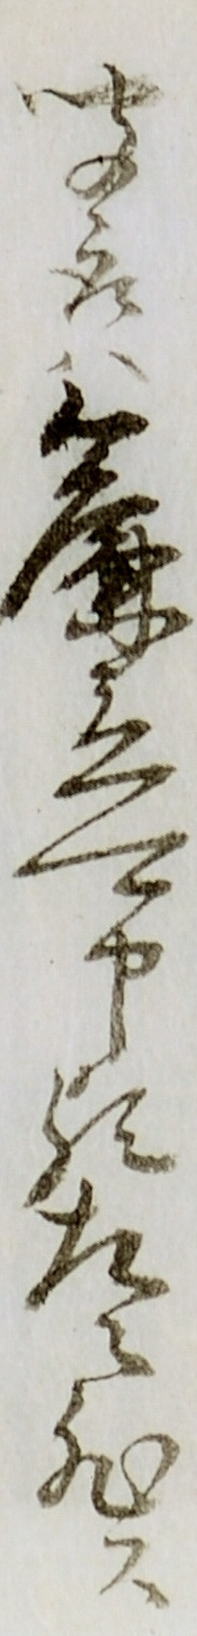聞取は麁立可申歟左に非ス
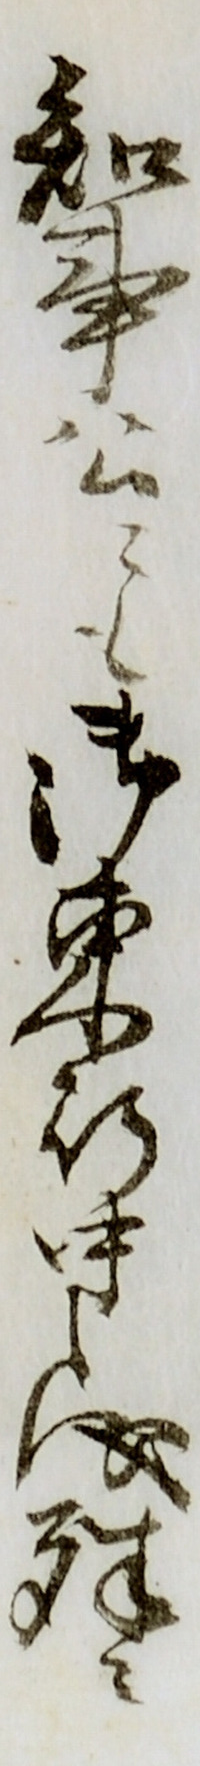知事公にも御東行中之儀殊に
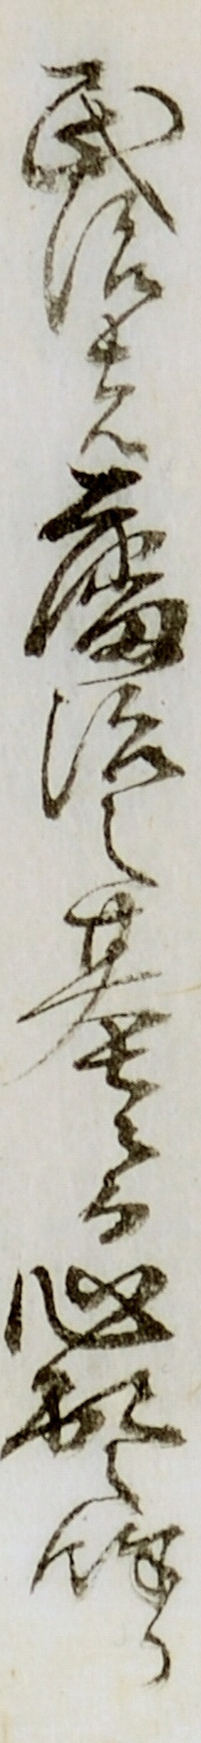民治は藩治之基にて心配之余り
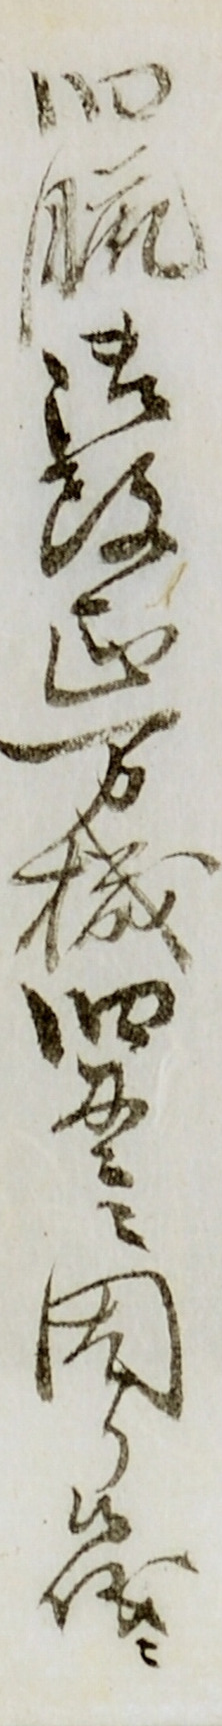旧臘御改正万機旧貫に因り候儀に
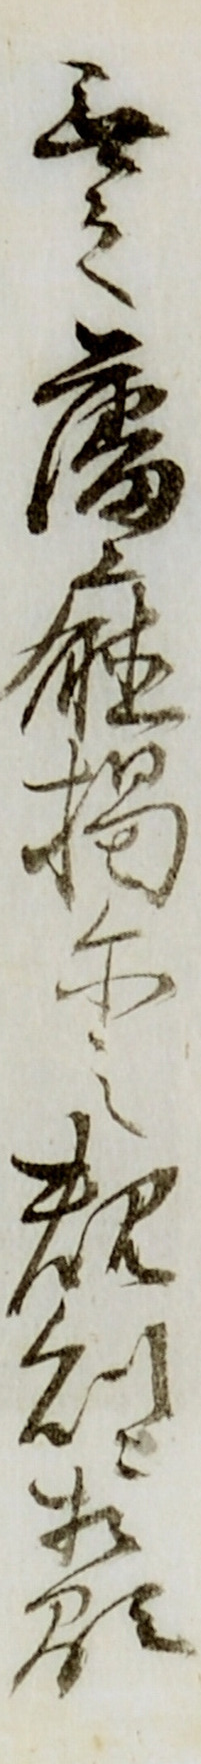無之藩庁掲示之規則に相顕
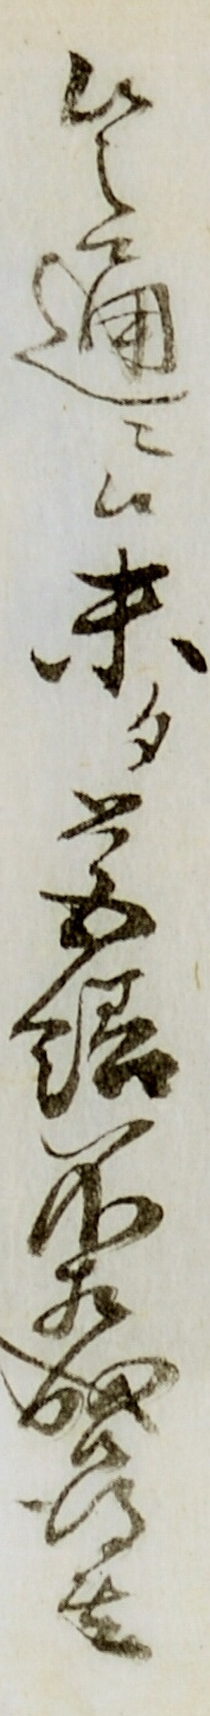候之通に候未タ営繕不相成候得共
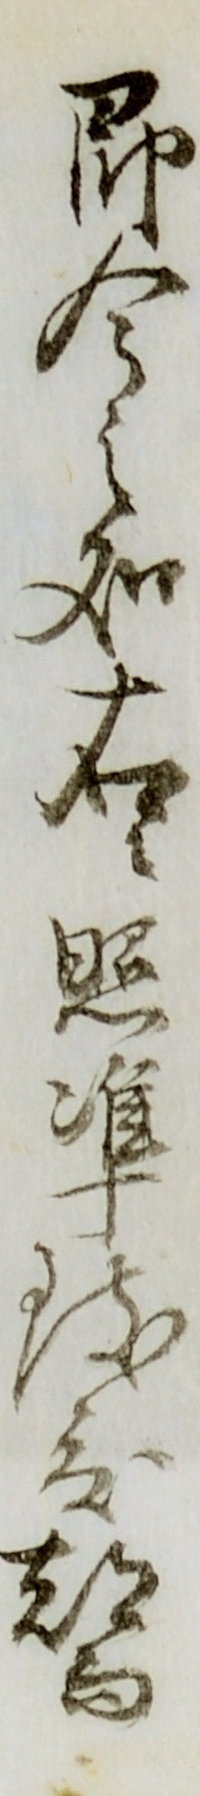即今之処右に照準致度都て
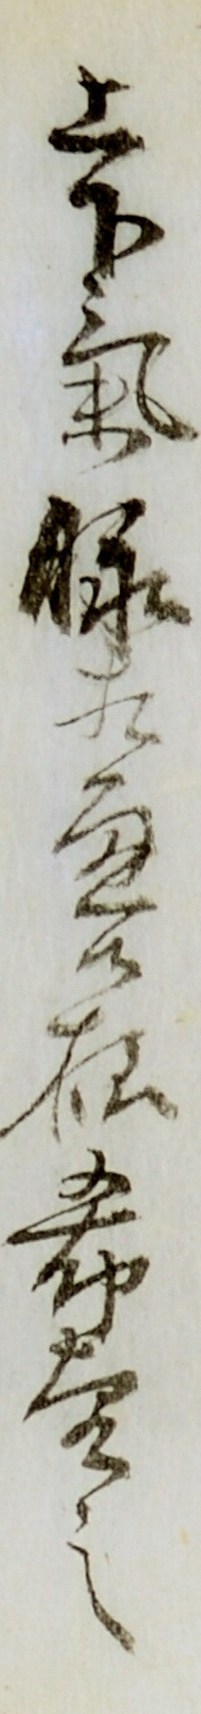上下気脈相通候様希望之
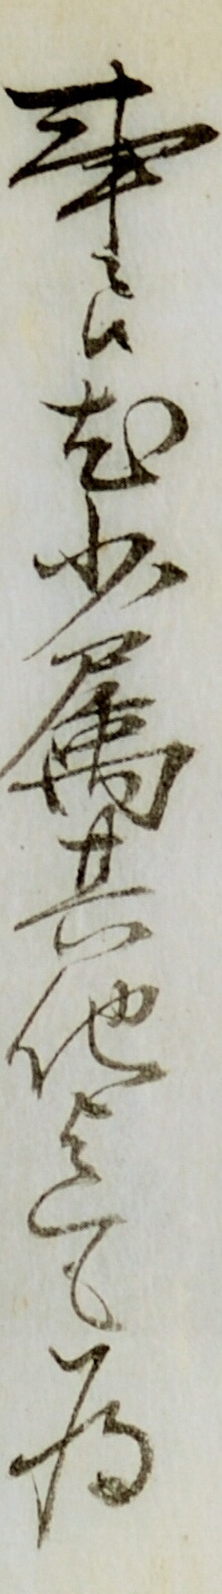事に候尤少属其他迄も為

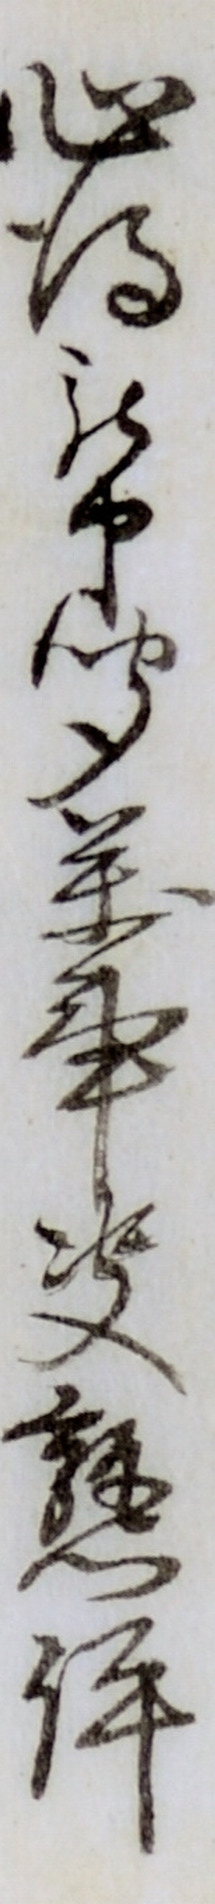心得被申聞万事決熟評
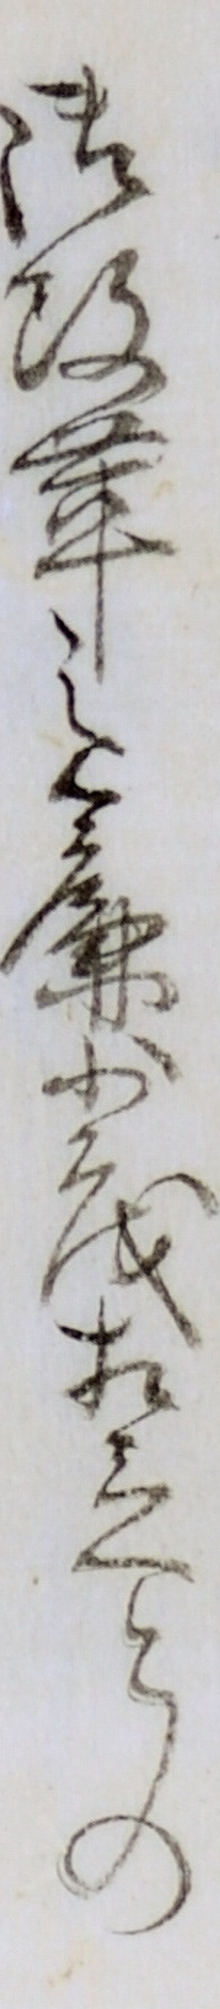御改革之麁少も相立との
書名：山林方諸事御用留
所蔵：伊那市立高遠町図書館・合同会社AMANE
